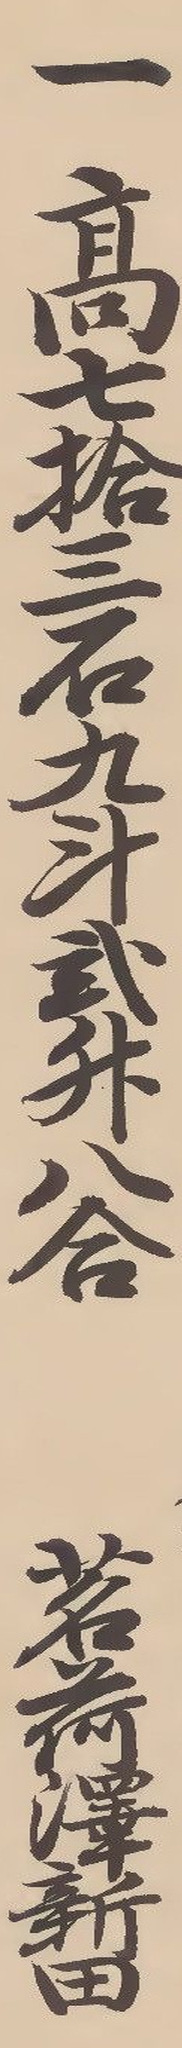一高七拾三石九斗弐升八合茗荷沢新田
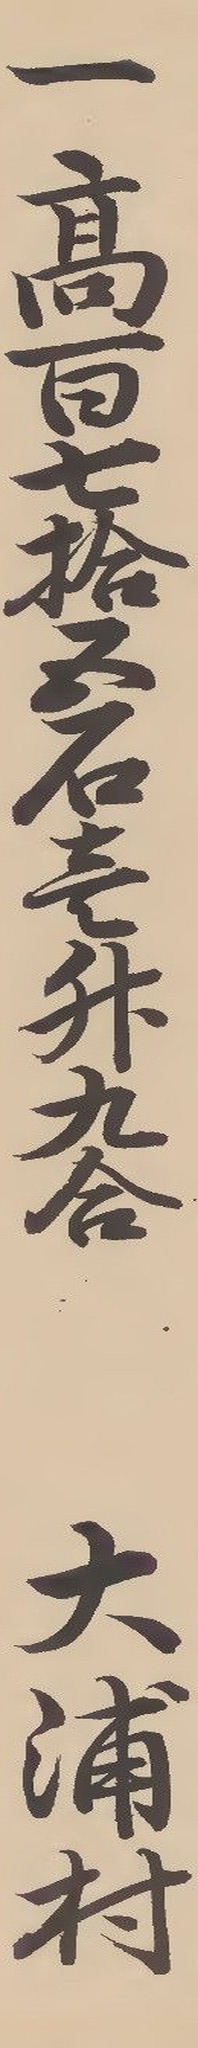一高百七拾五石壱升九合大浦村
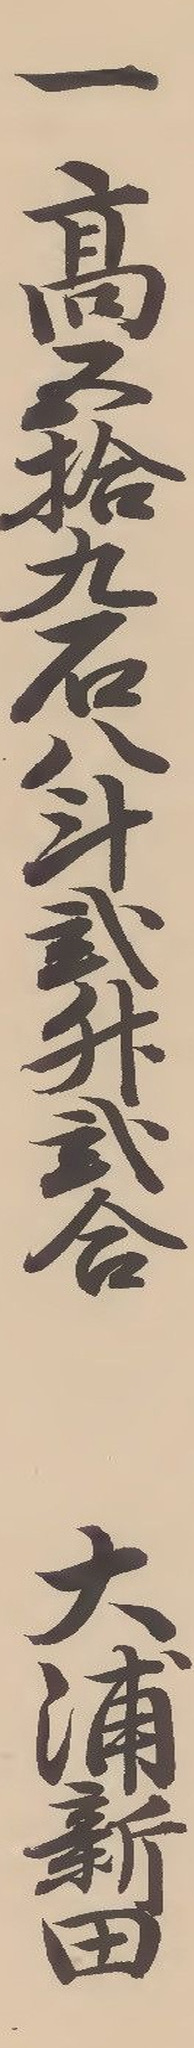一高五拾九石八斗弐升弐合大浦新田
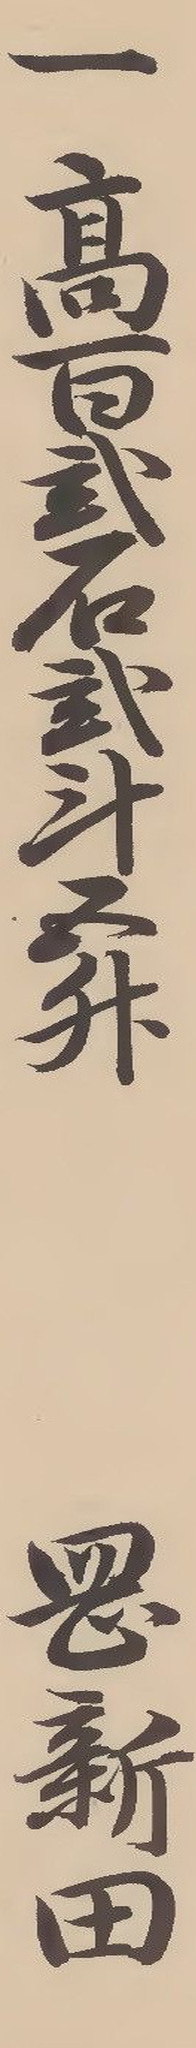一高百弐石弐斗五升岡新田
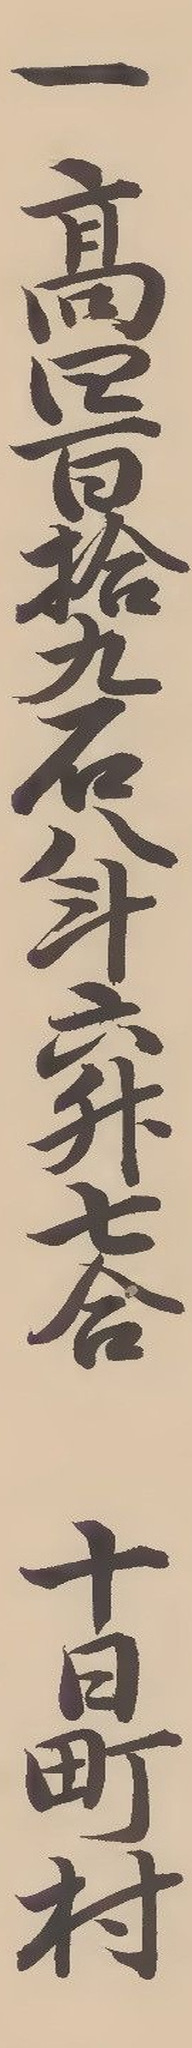一高四百拾九石八斗六升七合十日町村

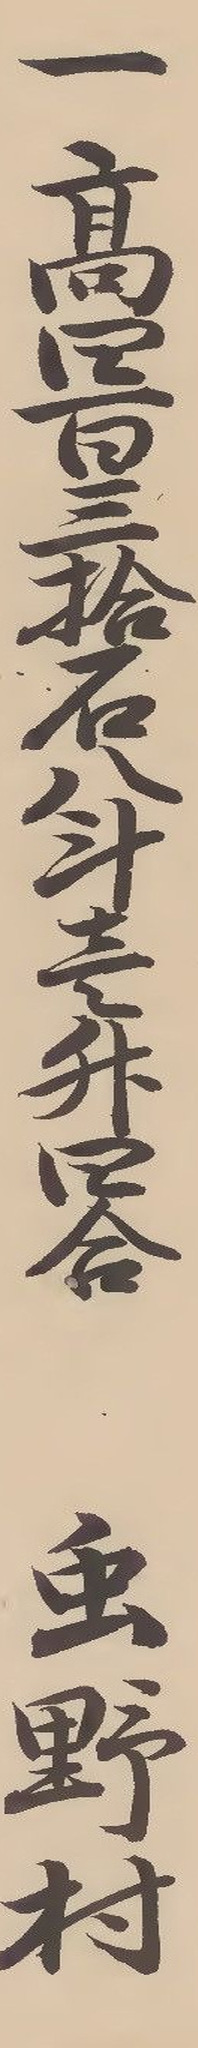一高四百三拾石八斗壱升四合虫野村
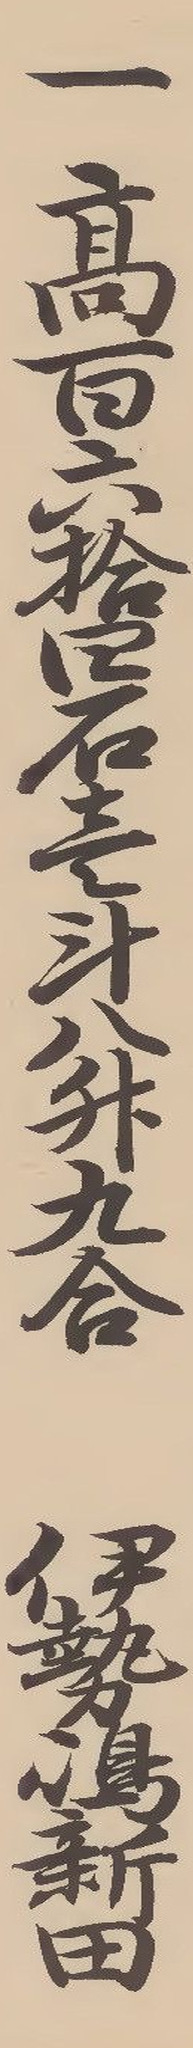一高百六拾四石壱斗八升九合伊勢島新田
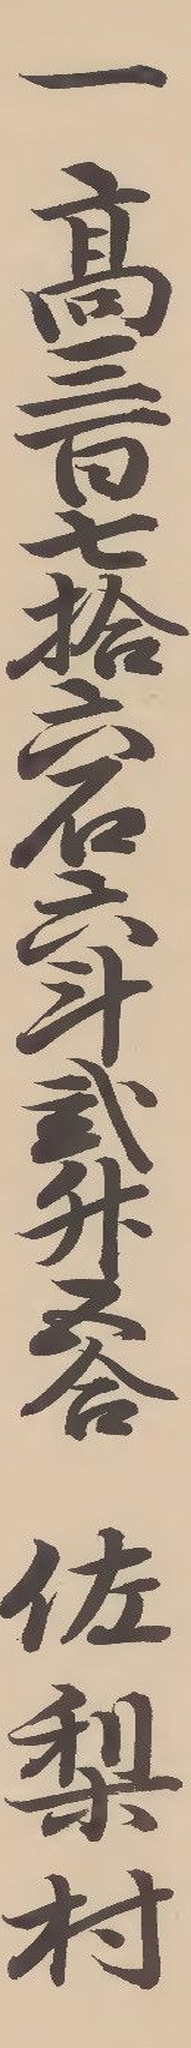一高三百七拾六石六斗弐升五合佐梨村
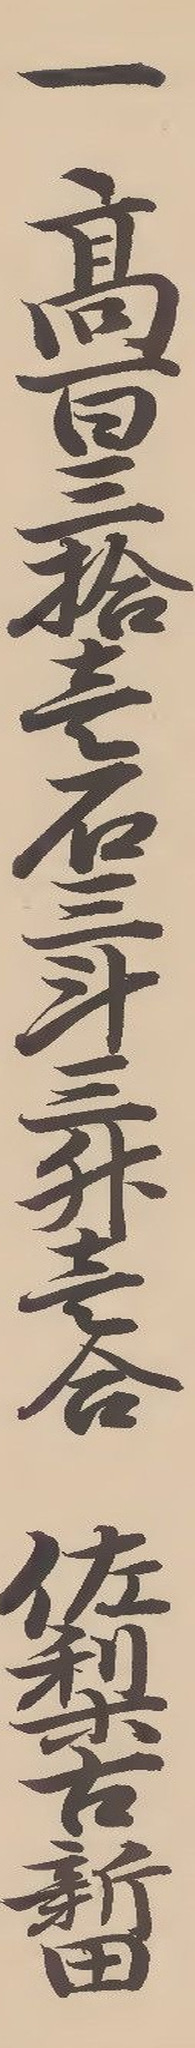一高百三拾壱石三斗三升壱合佐梨古新田
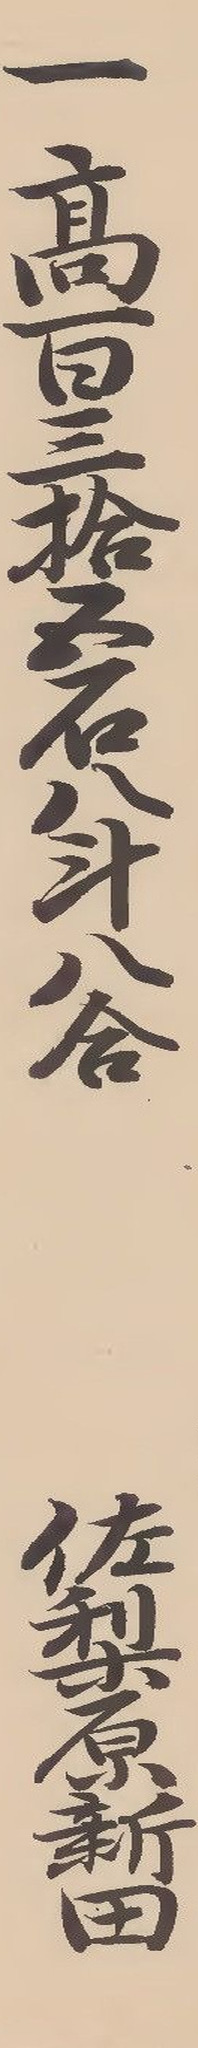一高百三拾五石八斗八合佐梨原新田
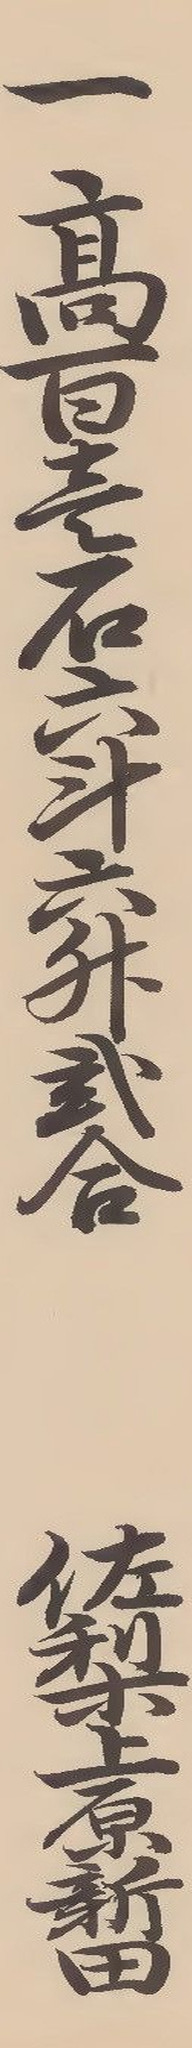一高百壱石六斗六升弐合佐梨上原新田
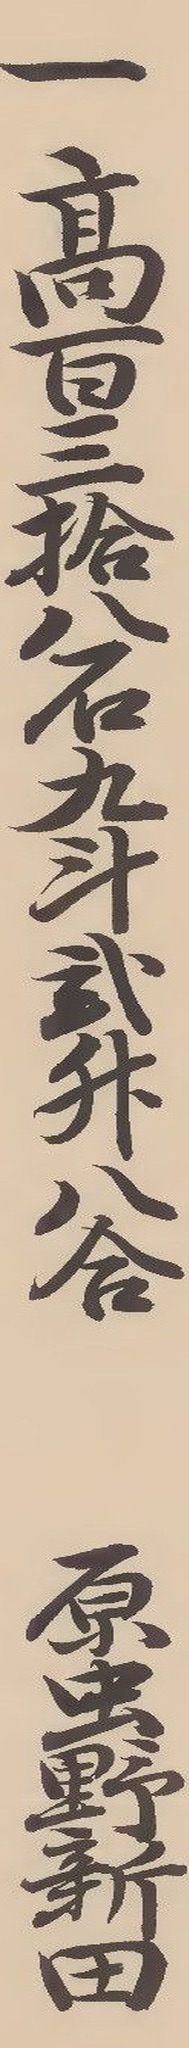一高百三拾八石九斗弐升八合原虫野新田
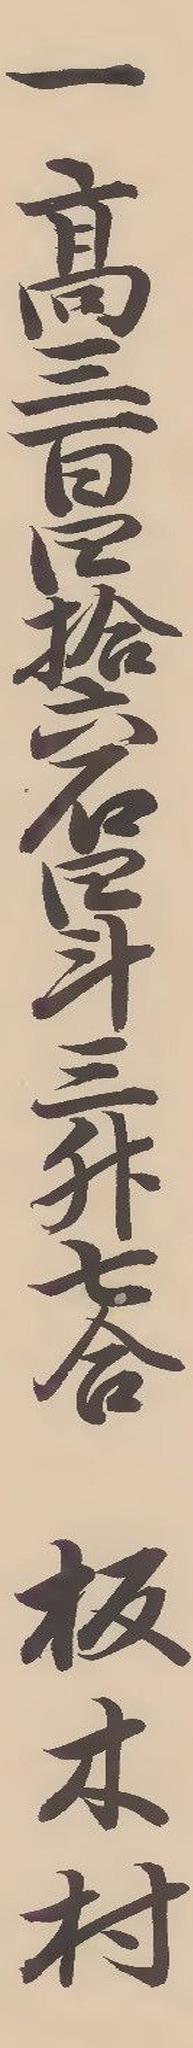一高三百四拾六石四斗三升七合板木村

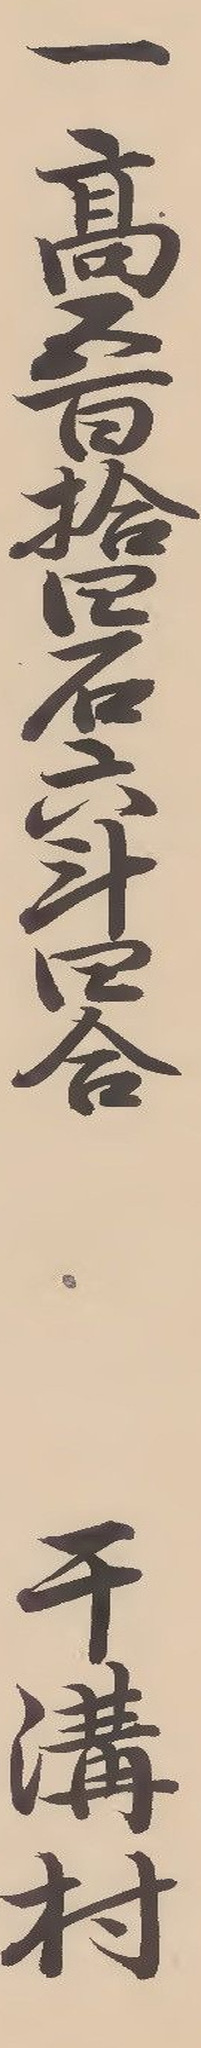一高五百拾四石六斗四合干溝村
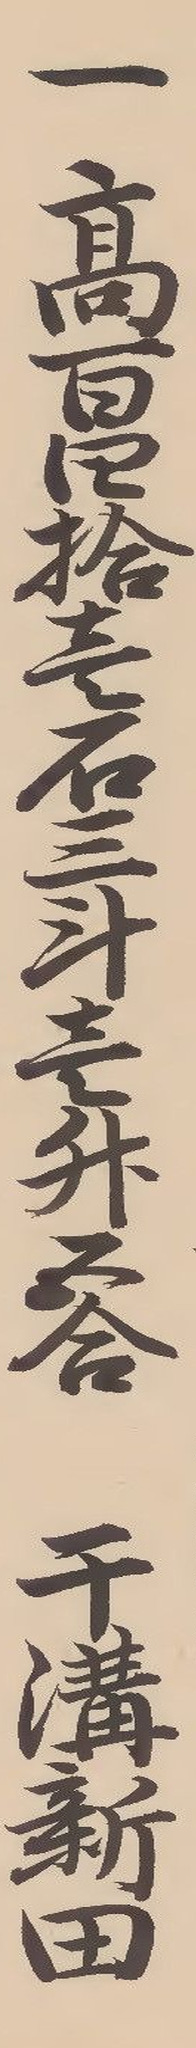一高百四拾壱石三斗壱升五合干溝新田
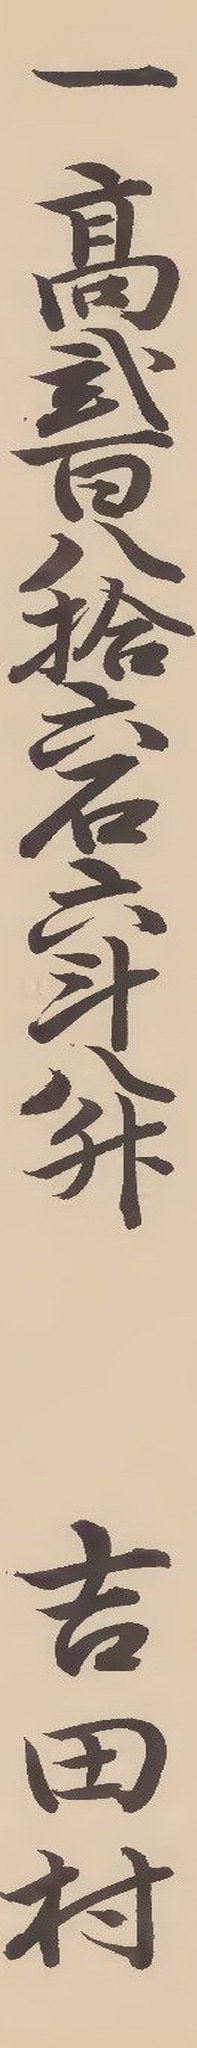一高弐百八拾六石六斗八升吉田村
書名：越後国郷帳　中
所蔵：国立公文書館 National Archives of Japan
